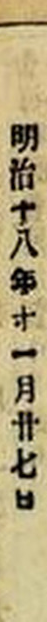明治十八年十一月廿七日
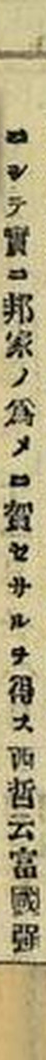ニシテ実ニ邦家ノ為メニ賀セサルヲ得ズ西哲云富国強
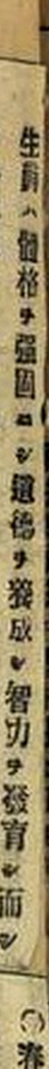生員ハ骨格ヲ強固ニシ遺徳ヲ養成シ智力ヲ発育シ而シ
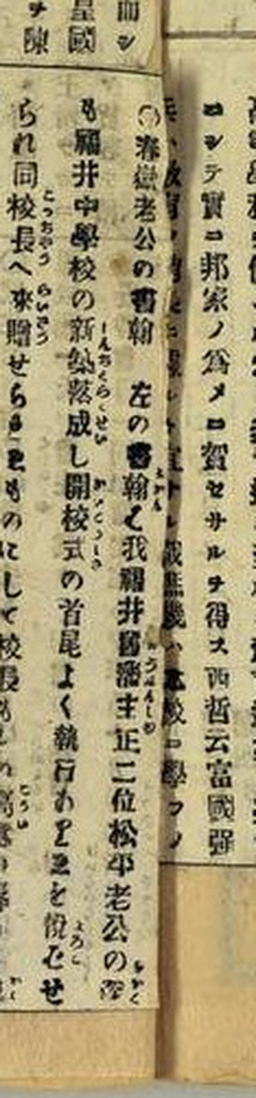〇春嶽老公の書翰左の書翰は我福井旧藩主正二位松平老公の深
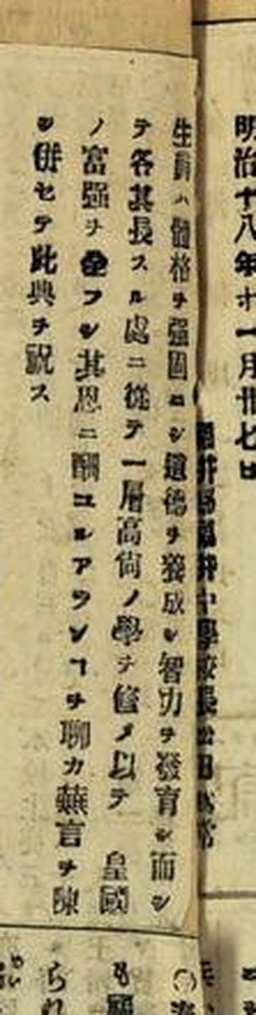テ各其長スル処ニ従テ一層高尚ノ学ヲ隆メ以テ皇国
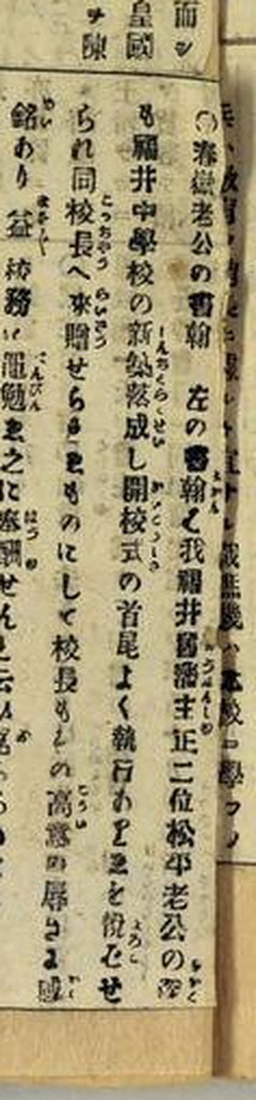も福井中学校の新築落成し開校式の首尾よく執行なりしを悦ばせ
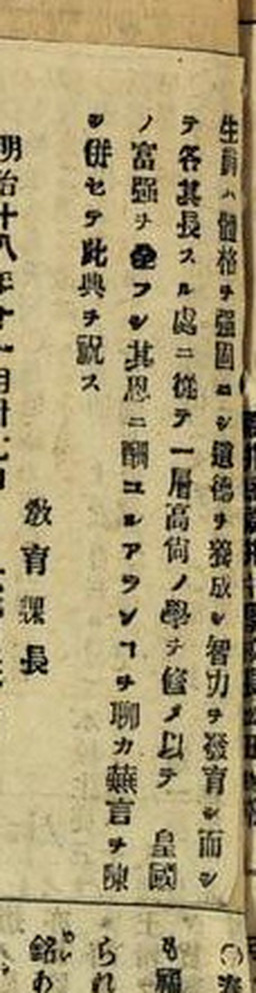ノ富強ヲ全フシ其恩ニ酬ユルアランヿヲ聊カ蕪言ヲ陳
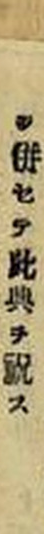シ併セテ此典ヲ祝ス
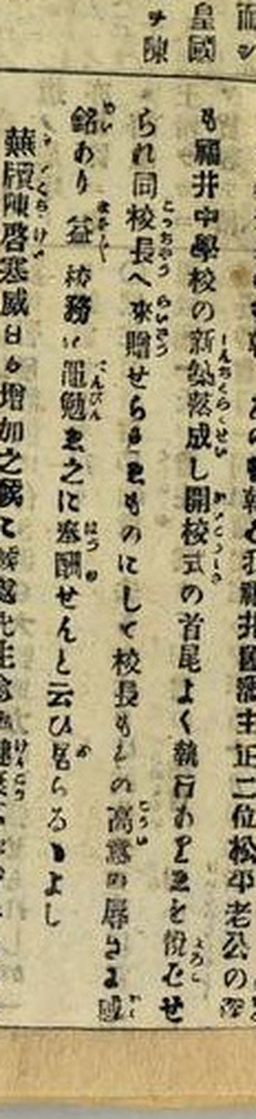られ同校長へ来贈せられしものにして校長もその高意の辱きに感
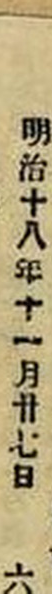明治十八年十一月廿七日
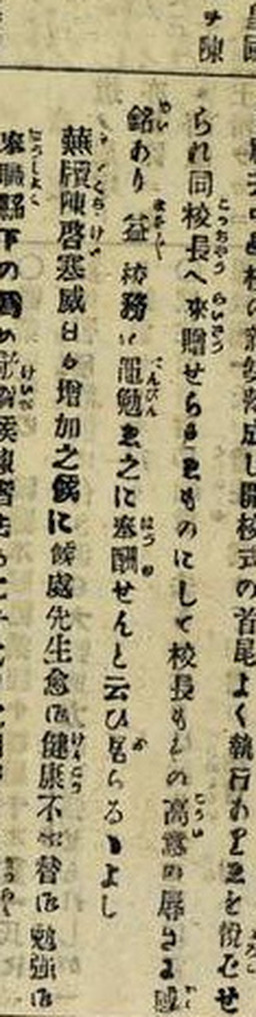銘あり益校務黽勉し之に奉酬せんと云ひ居らるゝよし
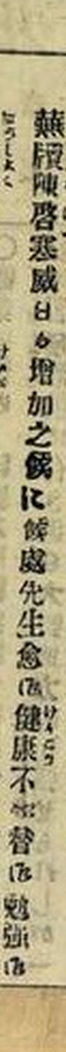蕪牘陳啓寒威日々増之侯に候処先生愈御健康不相替御勉強御
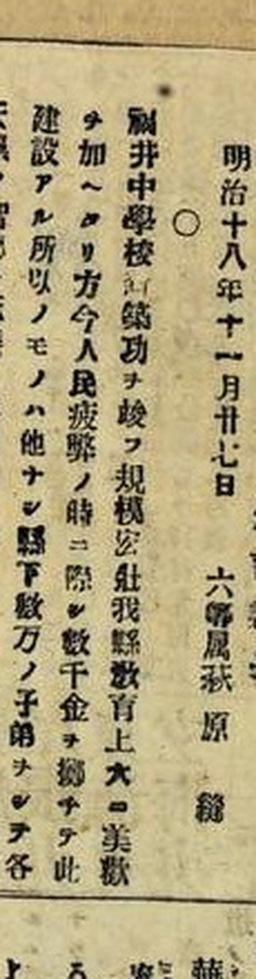福井中学校新築功ヲ竣フ規模宏壮我県教育上大ニ美歓
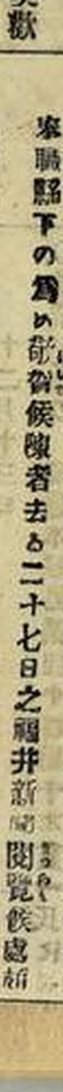奉職県下の為め敬賀候陳者去る二十七日之福井新聞閲覧候処頗
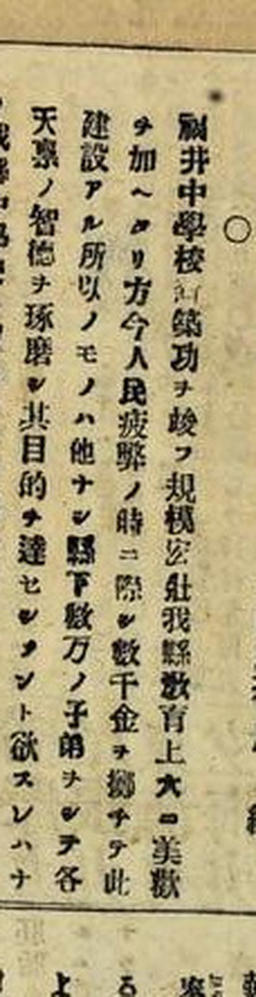ヲ加ヘタリ方今人民疲弊ノ時ニ際シ数千金ヲ擲チテ此
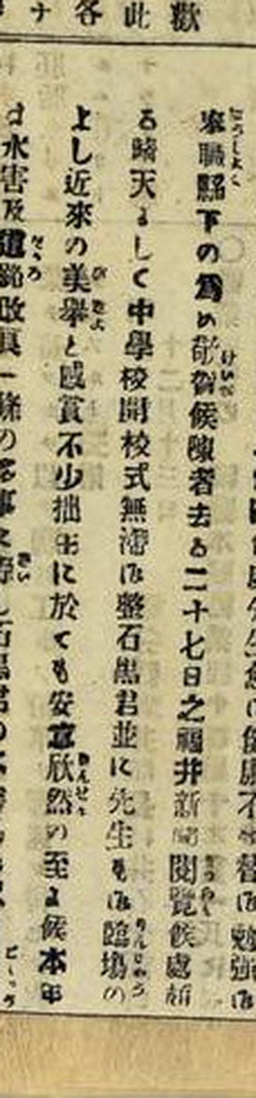る晴天にして中学校開校式無滞御整石黒君並に先生も御臨場の
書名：温古集 五巻
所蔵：福井県文書館 Fukui Prefectural Archives
